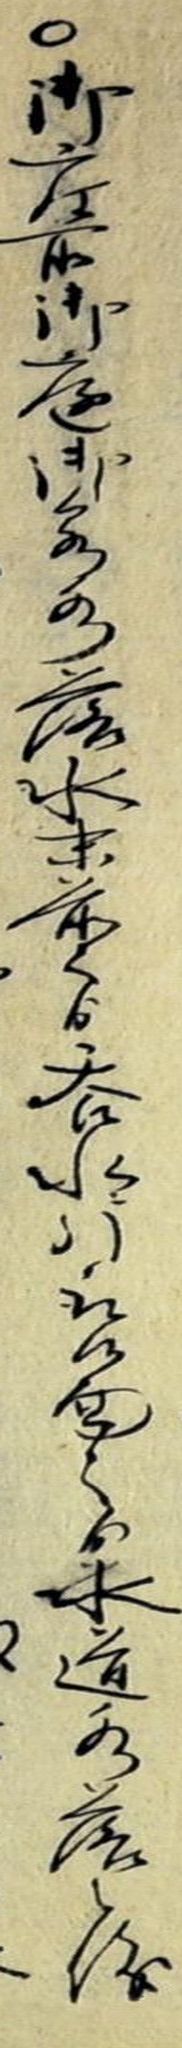〇御座所御庭御泉水落水末前々ゟ呑水ニ引取候面々ゟ水道水落之儀
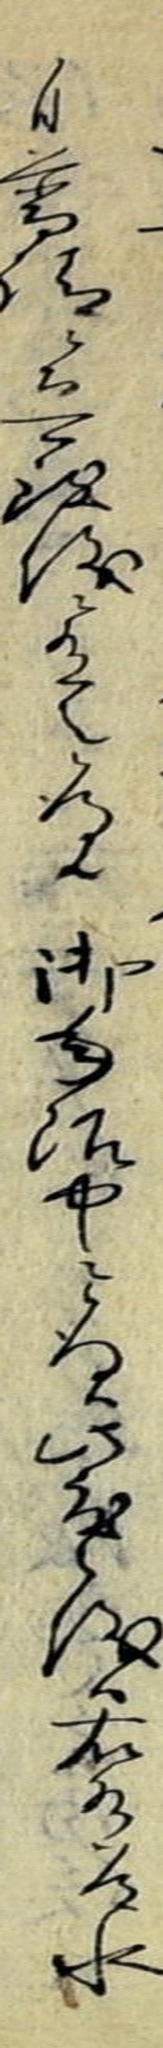自普請ニ而可致儀ニ有之候得共御年限中ニ候得ハ此度之儀ハ右水道水
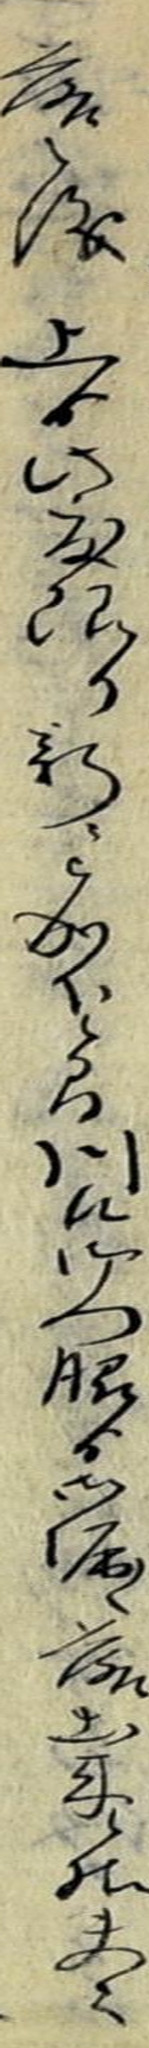落之儀上ゟ此度限り新ニ被成下候間川口御門脇ゟ御堀へ落出来候様夫々
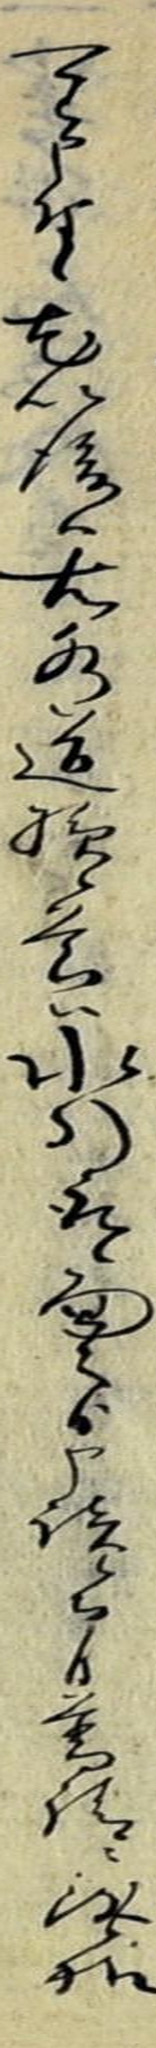可被申付候尤以後ハ右水道損候節ハ水引取候面々ゟ申談候而自普請ニ致候様
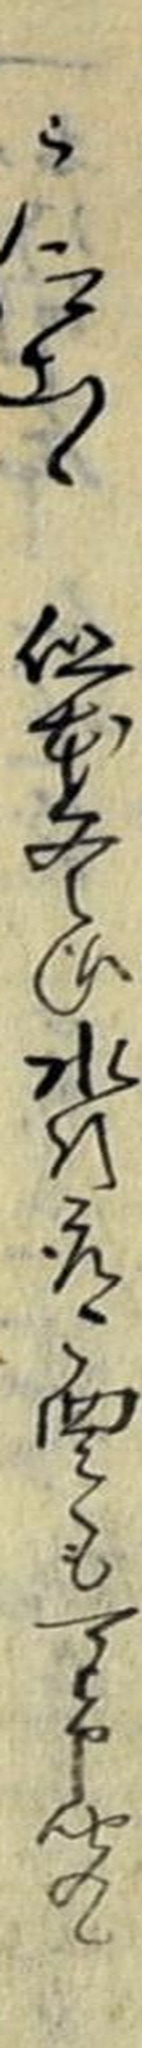被仰出候但本文之趣水引取候面々へも可被申聞候
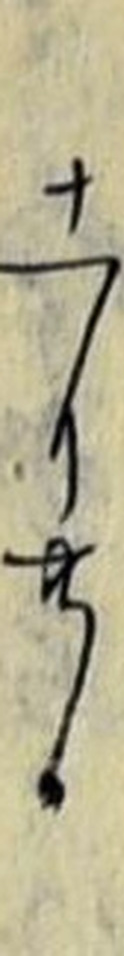十一月廿日
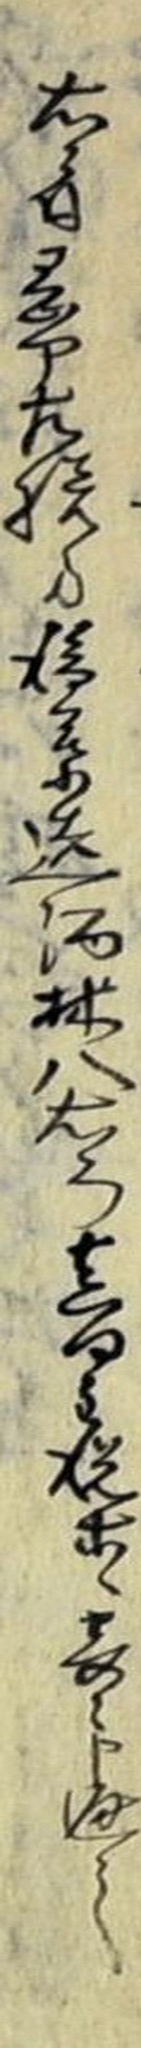右ニ付岡部左膳方稲葉造酒林八右衛門真田主税等へ寄々申通之
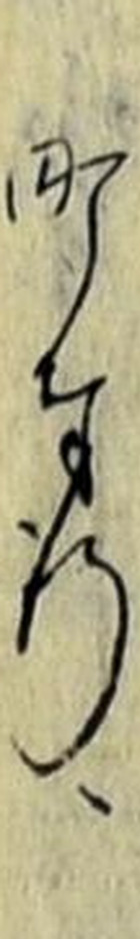町奉行へ
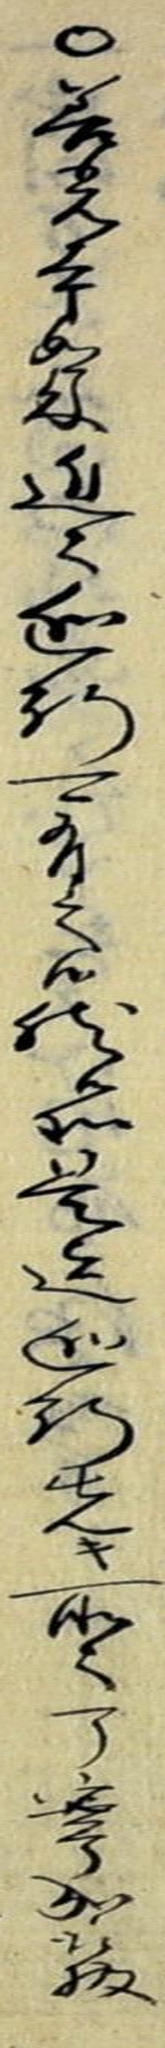〇善光寺如来近々巡行可有之候然ル処是迄巡行先キ所々丁寧成取扱
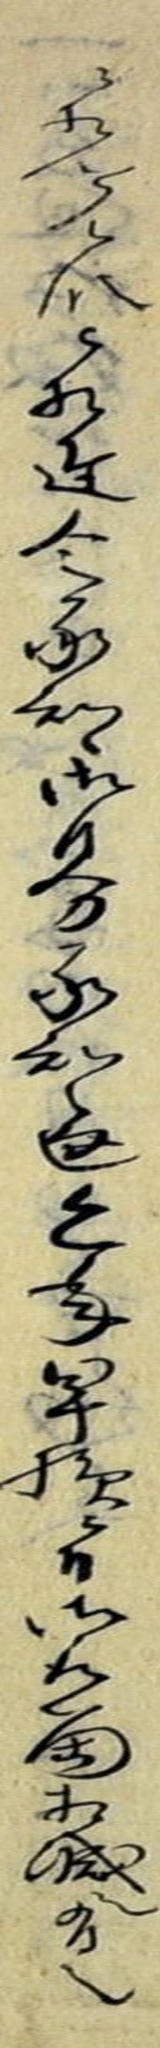ニ相聞候段被相達令承知候御自分承知之通今年旱損ニ付御取箇相減シ有之
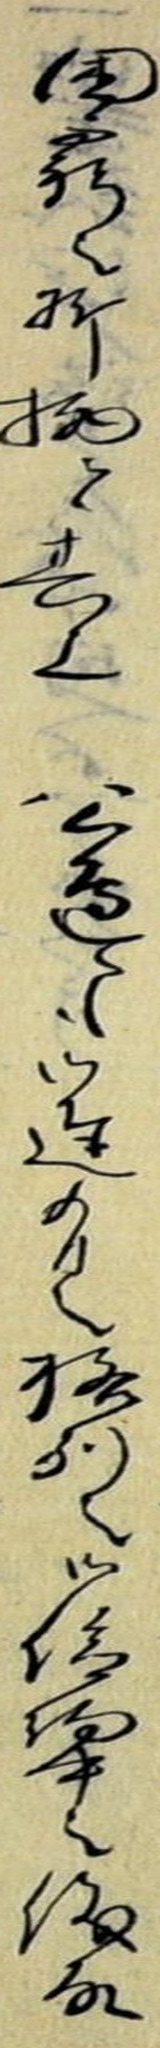困窮之折柄ニ候其上公辺へも御達有之格別之御倹約中之儀故
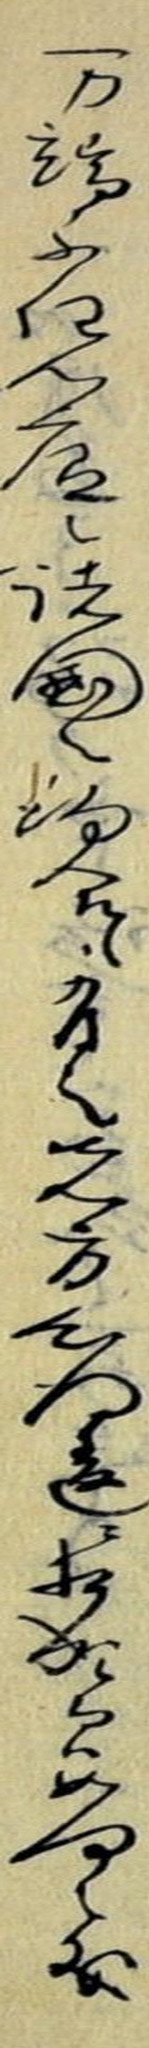万端不任心底候諸国之釣合も有之先方心得違ニ相成候而ハ如何之義
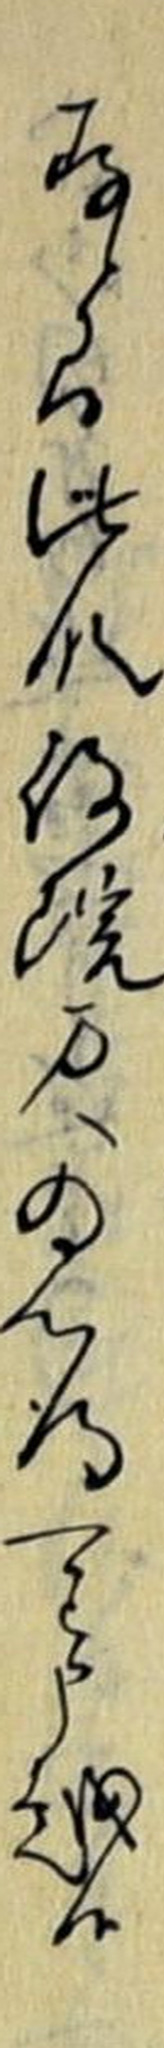存候間此段役院方へ為心得可被申越候
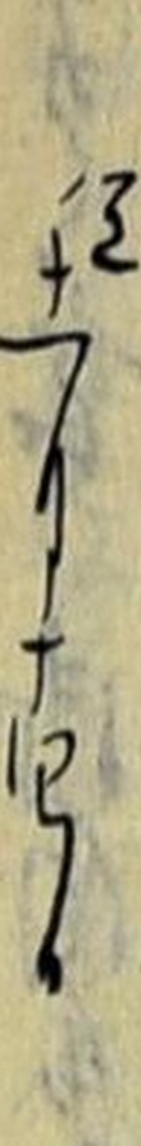閏十一月十四日
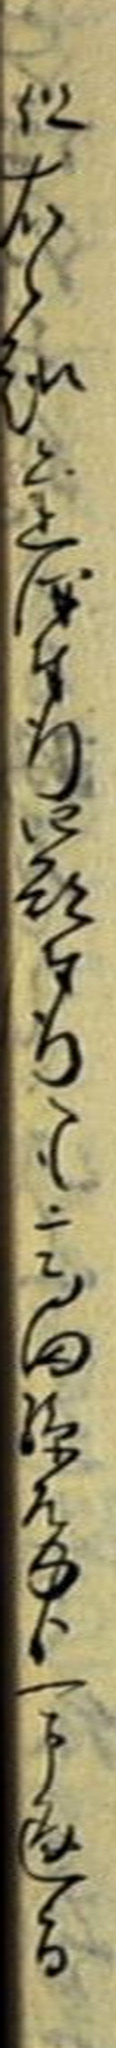但右之趣金津奉行四郡奉行へも高田孫左衛門ゟ可申通旨
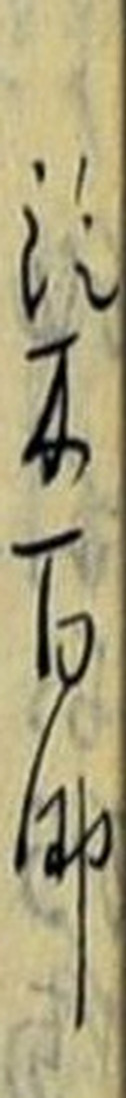鈴木百助
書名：命令之部 三
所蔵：福井県文書館 Fukui Prefectural Archives
